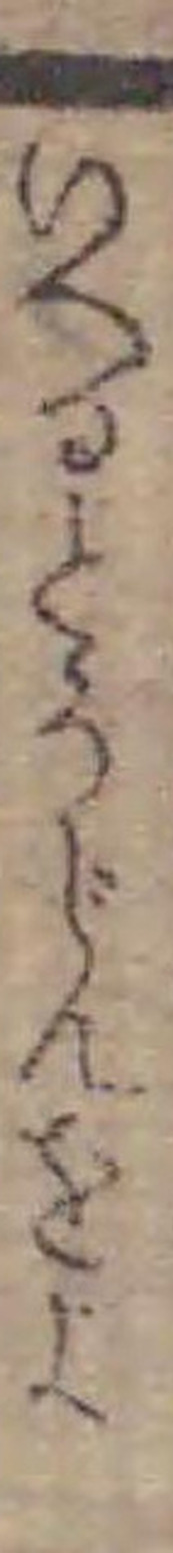いへるとうじんをよ
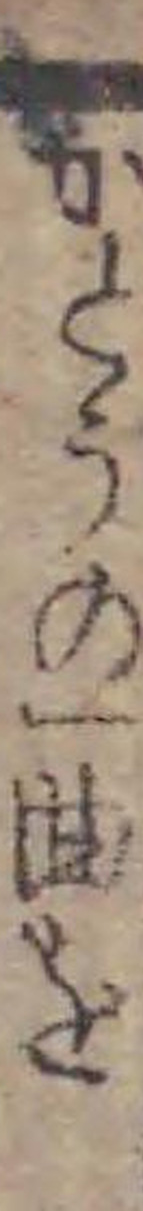かとうの一曲を
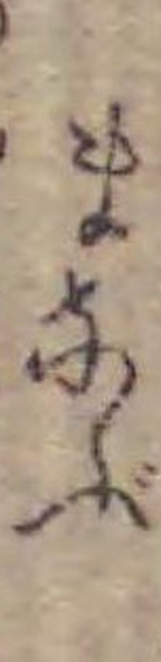まなぶ
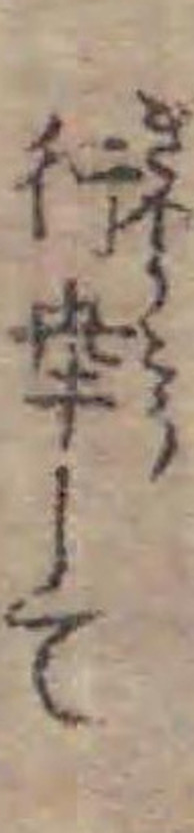行幸して
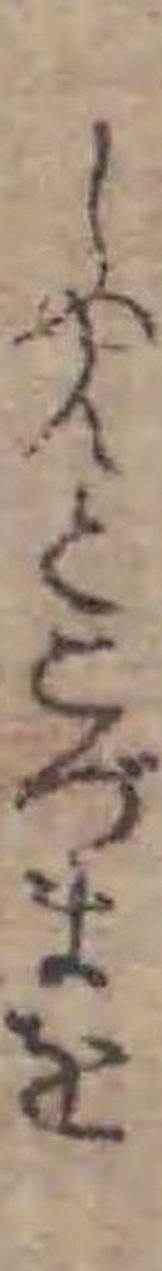しやんとこづまを
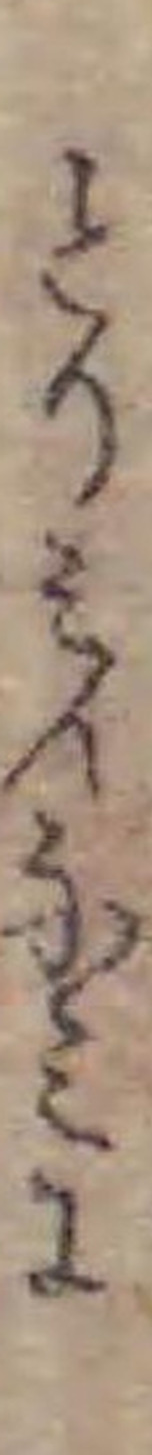とりみんなみに
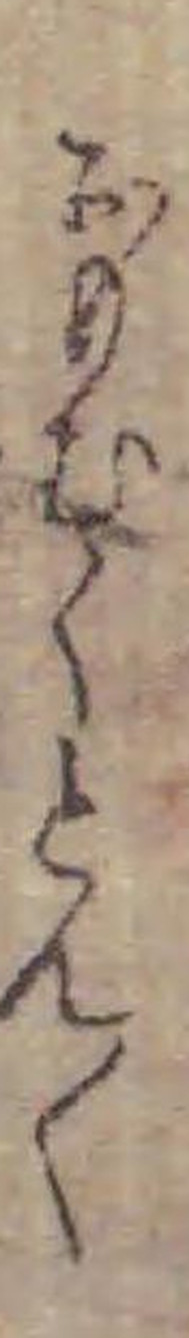おもむくとん〳〵
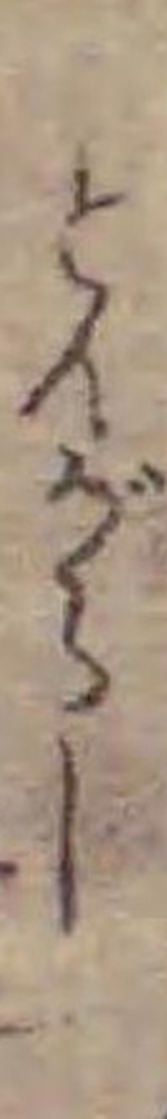とんがらし

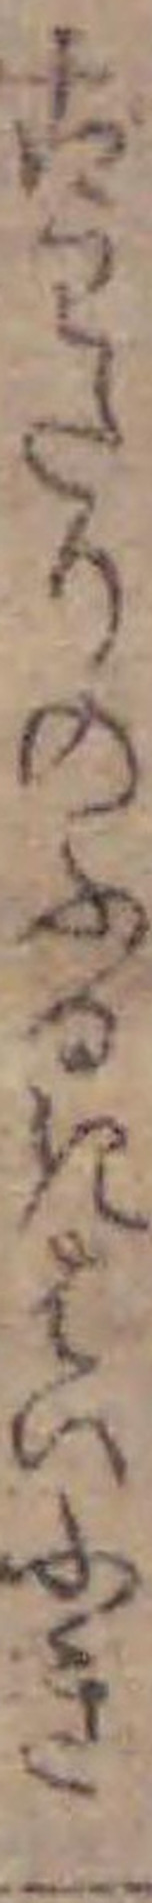古わたりのふるきはいふき
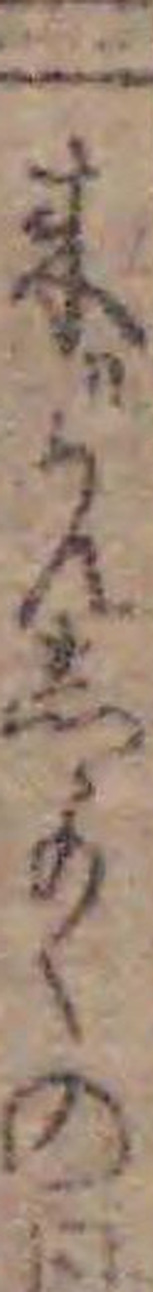来るかんしよくの日
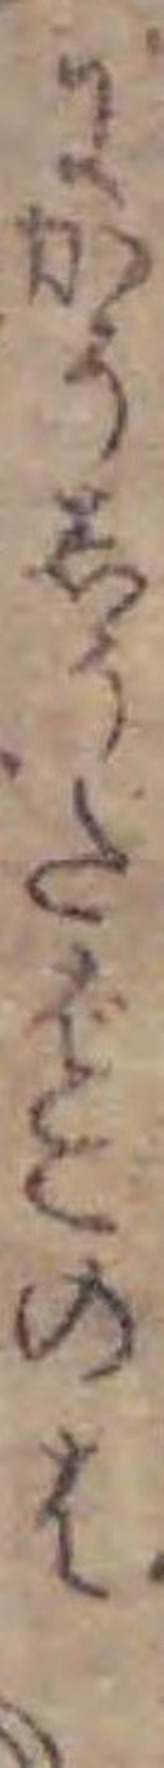にかうしうたばこのは
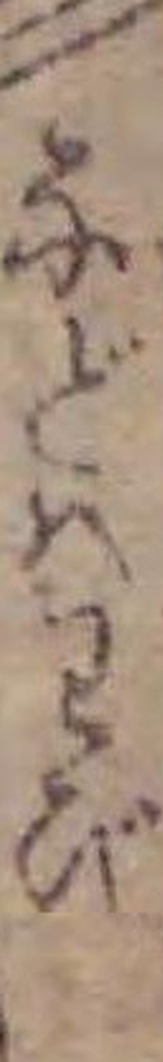などはわび
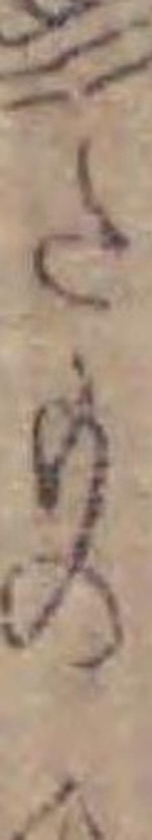たもの
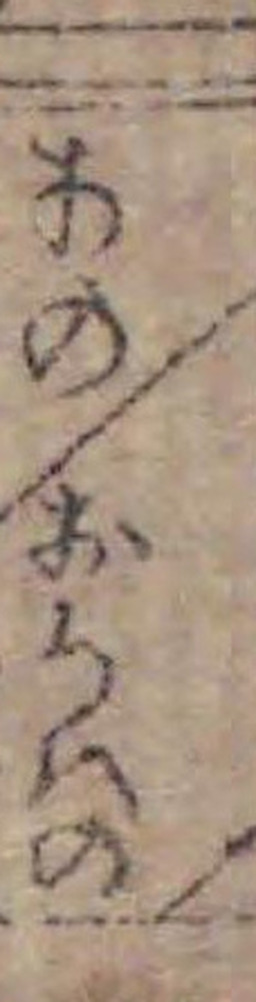あのおろ？はの
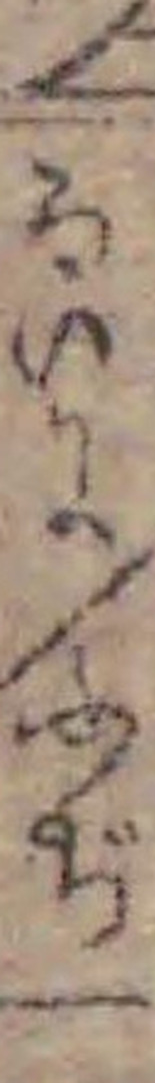るいにふぢ
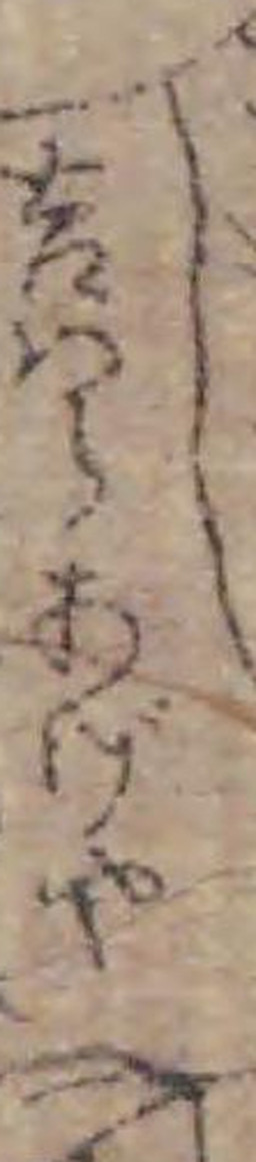吉はらのあげや
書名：此奴和日本 : 2巻
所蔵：国立国会図書館 National Diet Library, JAPAN
